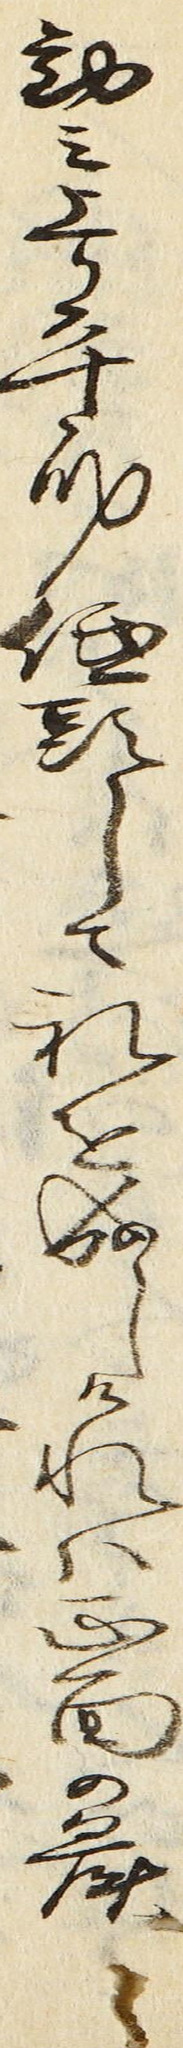勧ミ上り平身低頭して礼を成しけれハ正面の侯
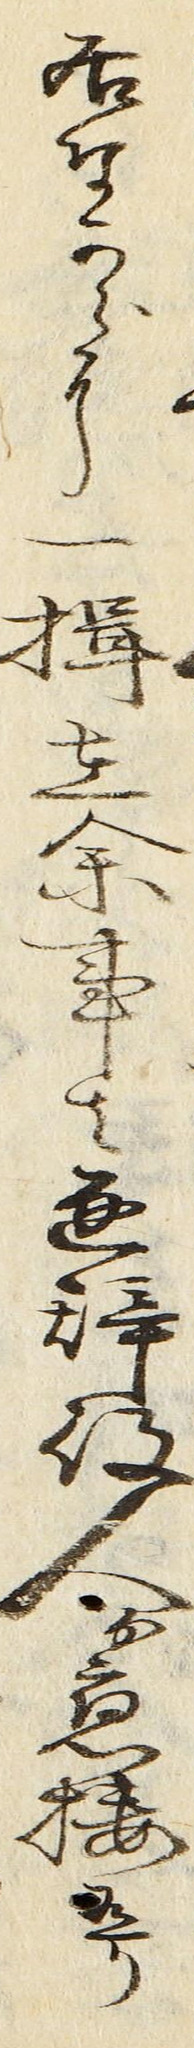居なからに一揖在余事は通辞役人ゟ応接有り
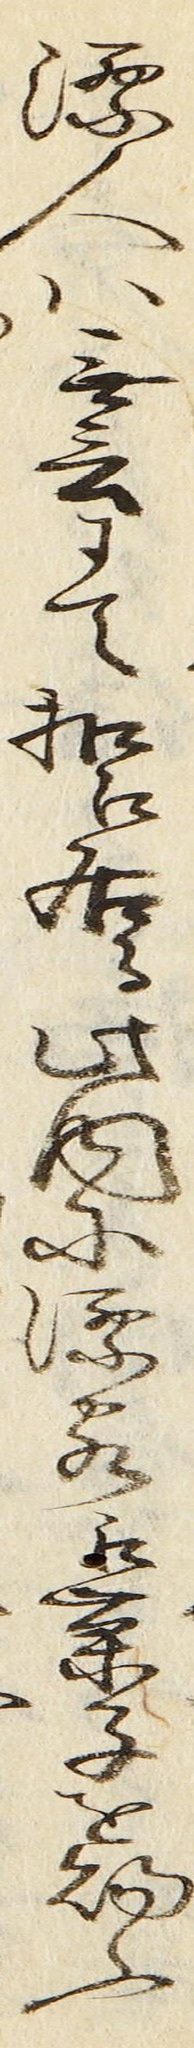漂人ハ無言にて控え居る此内に漂客え菓子を賜ふ
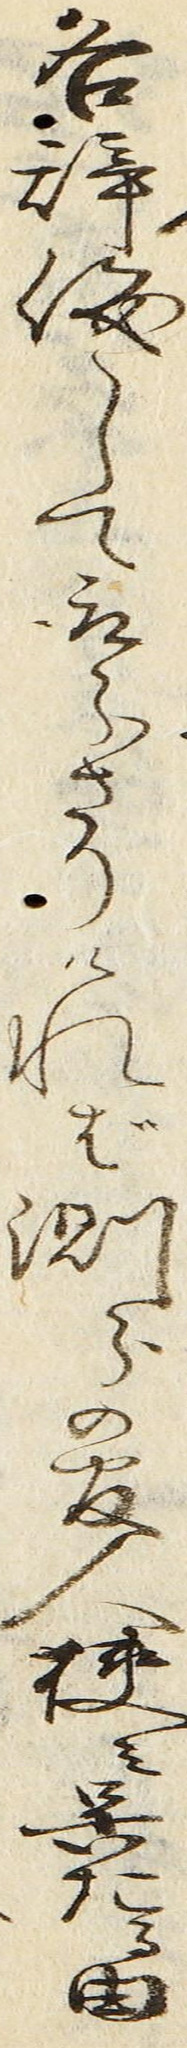各辞儀して取らさりければ側らの官人挟ミ呉たる由
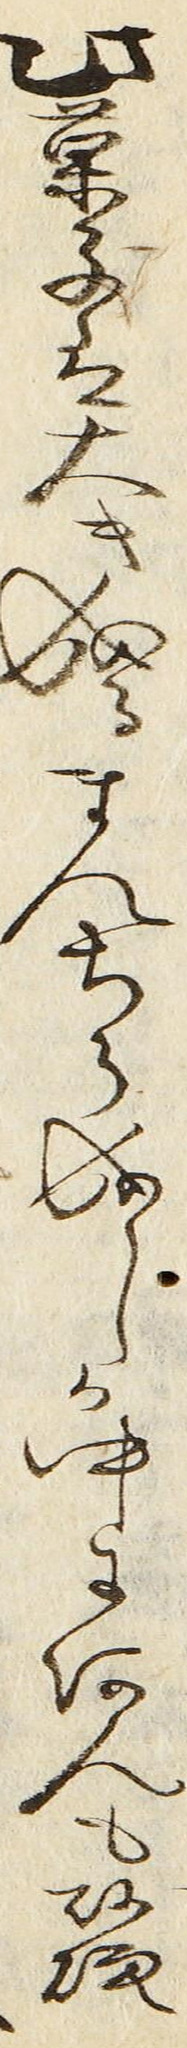此菓子は大キ成るまんちう成しか中にあんも砂糖
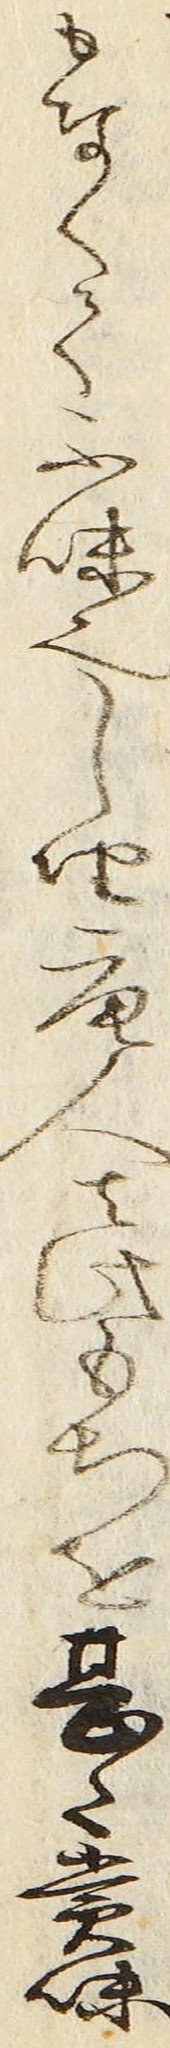もなくて不味也し由唐人は此もちを甚た賞味
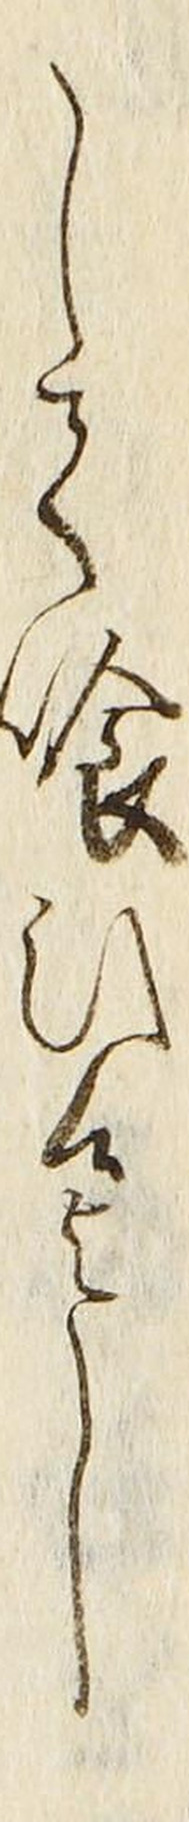して喰ひ候よし
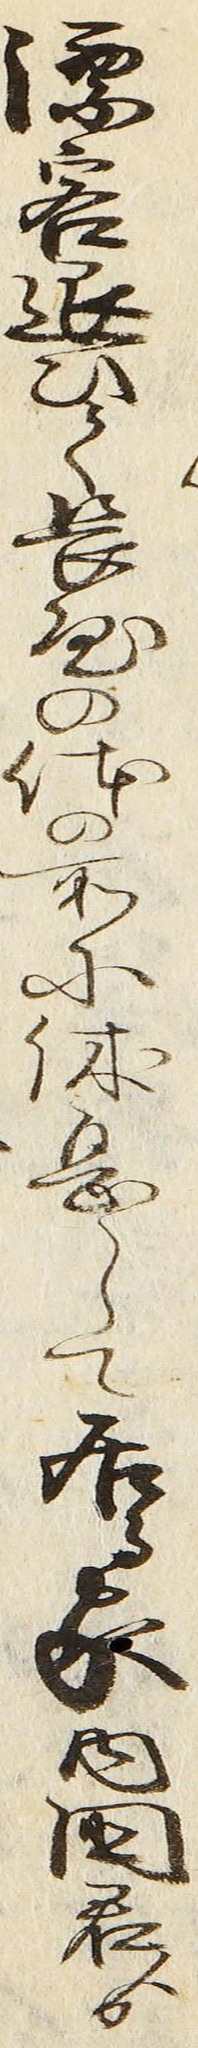漂客退ひて長屋の体の所に休息して居る家内国君ゟ
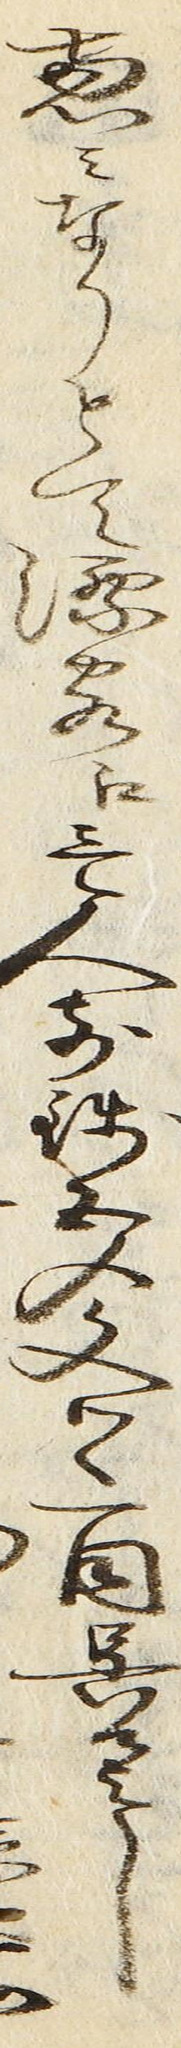恵ミなりとて漂客え壱人前銭五貫文ツヽ一同呉候よし
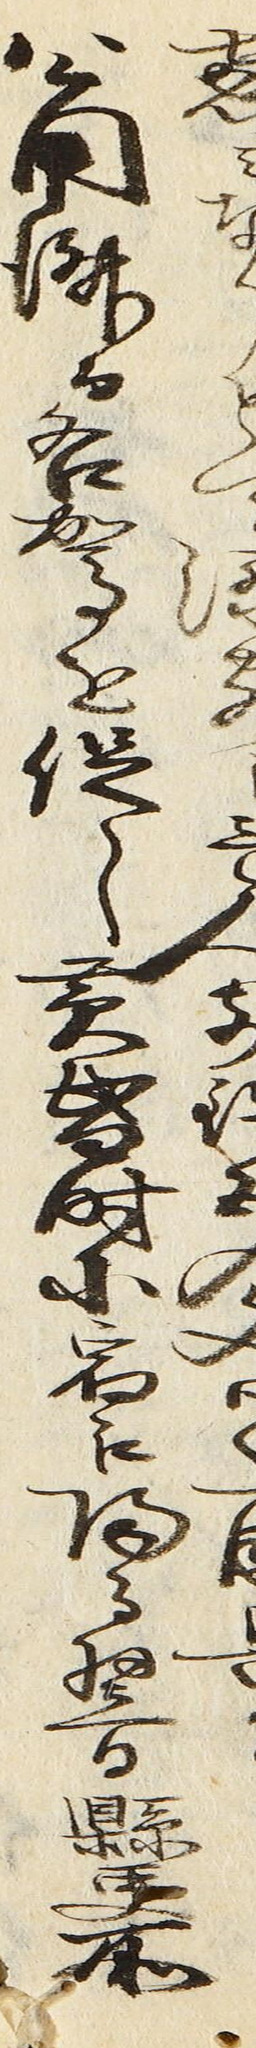公用済而各駕を促し黄昏時に宿え帰る翌日県吏所
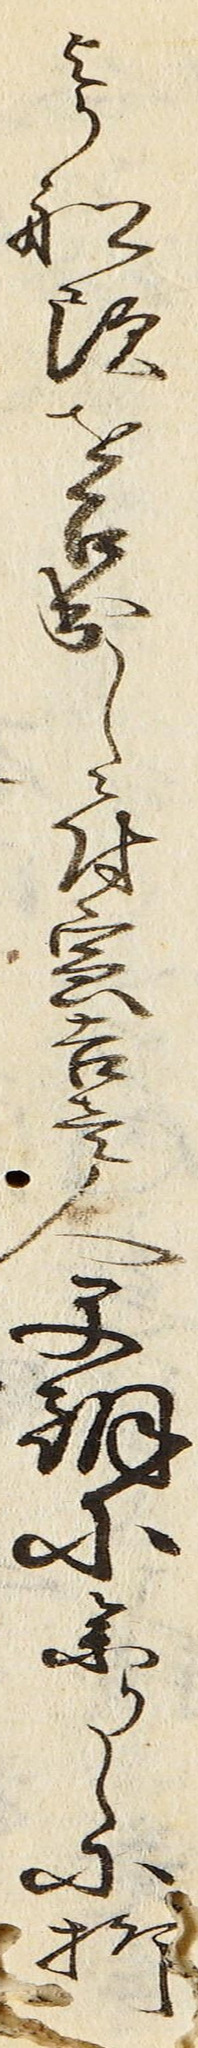より船頭を召出しニ付寅吉壱人早朝に参りしに折
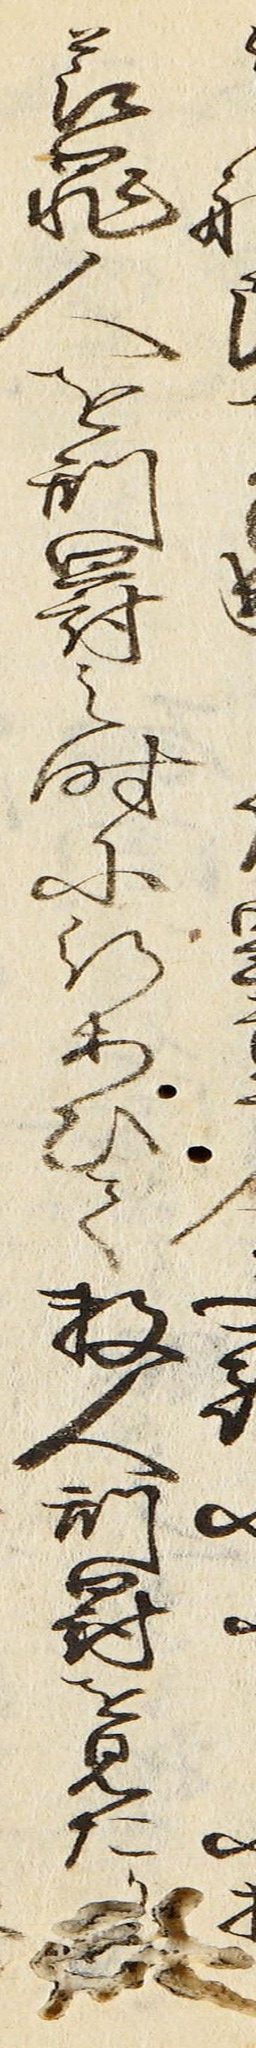節罪人を刑罰の時に行あひて数人刑罰を見たりと
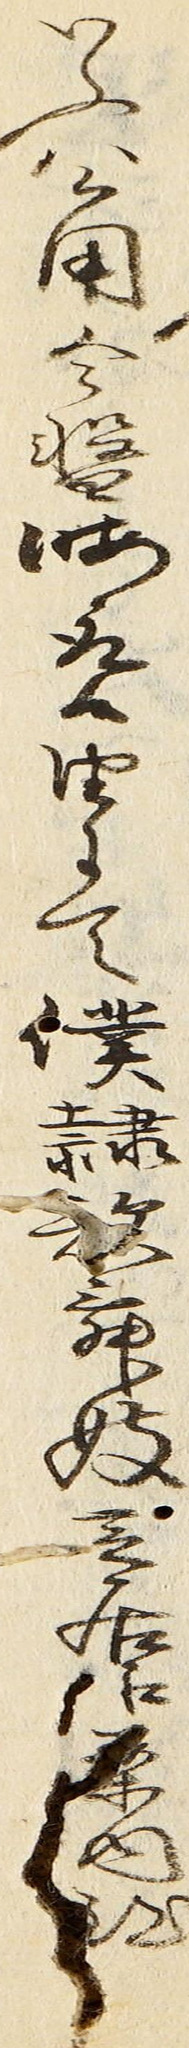いふ公用今暫暇取候由にて僕隷歓舞奴芝居え案内致
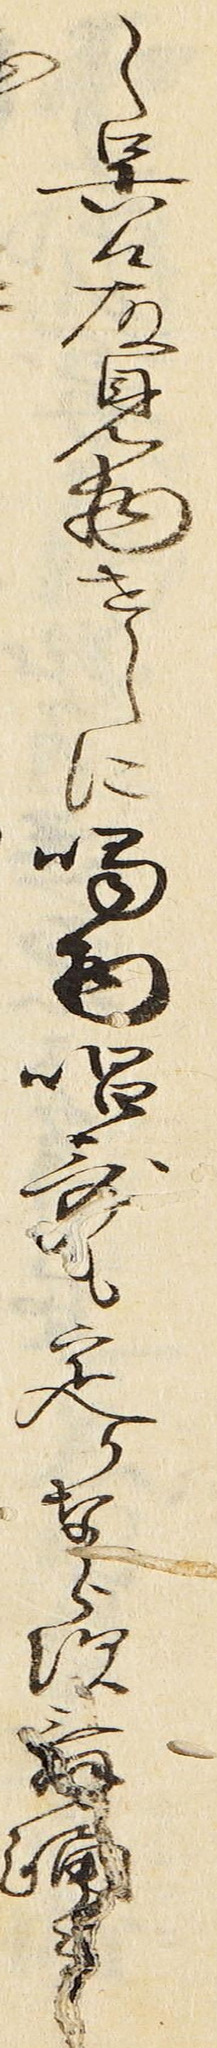し呉候故見物せしに鳴物唱歌も定りならす舞踊
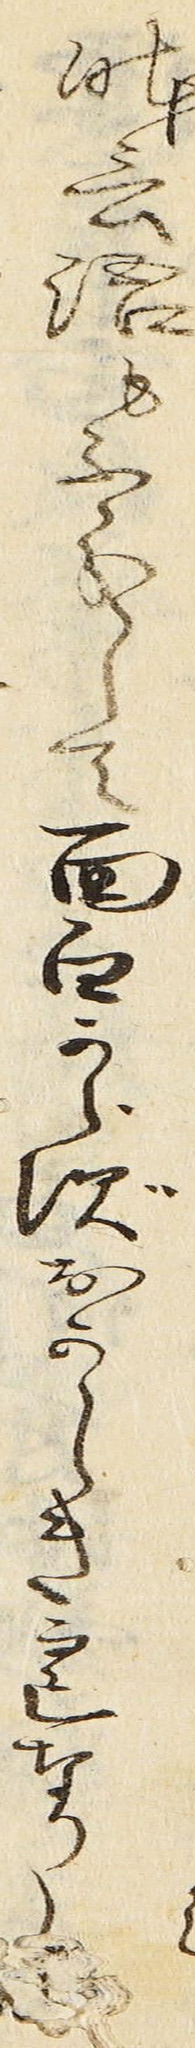日本言語も不分して面白からずおかしき而已なりし
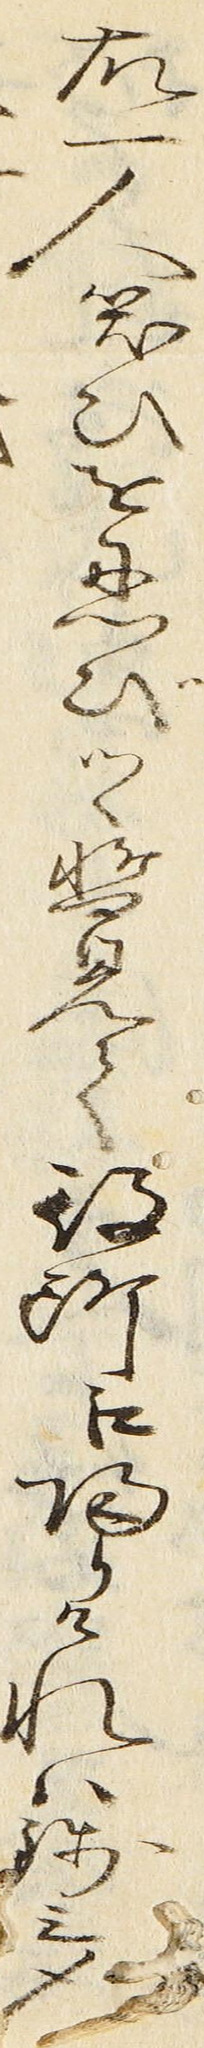故一人笑ひを忍びツヽ暫見て役所え帰りけれハ銭三貫
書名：亜墨利加漂流記聞
